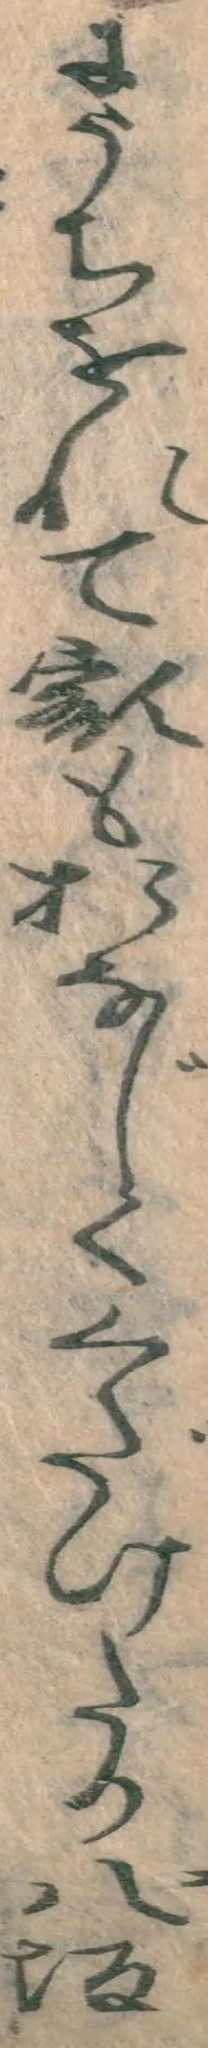にうちをれて額もおなじくくだけたり八坂
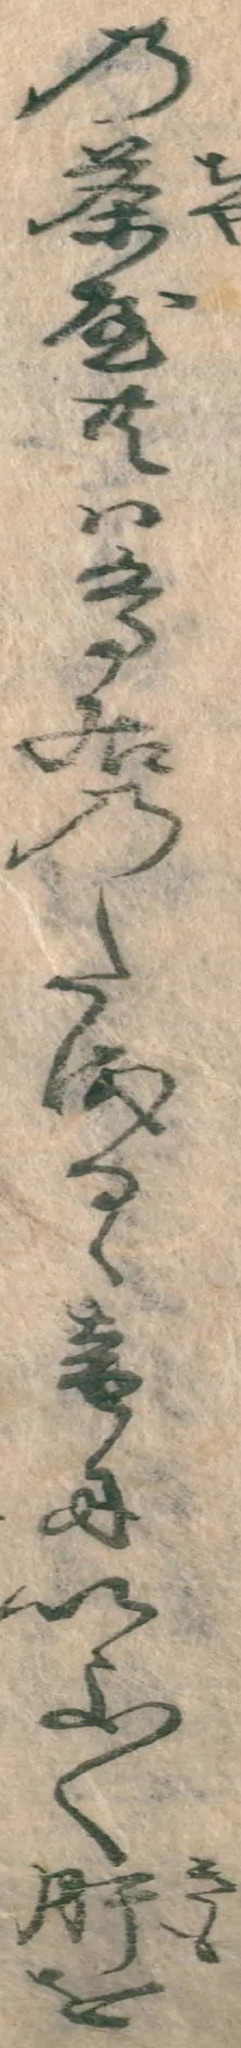の茶屋のは鳥居のたをるゝ音にいよ〳〵肝を
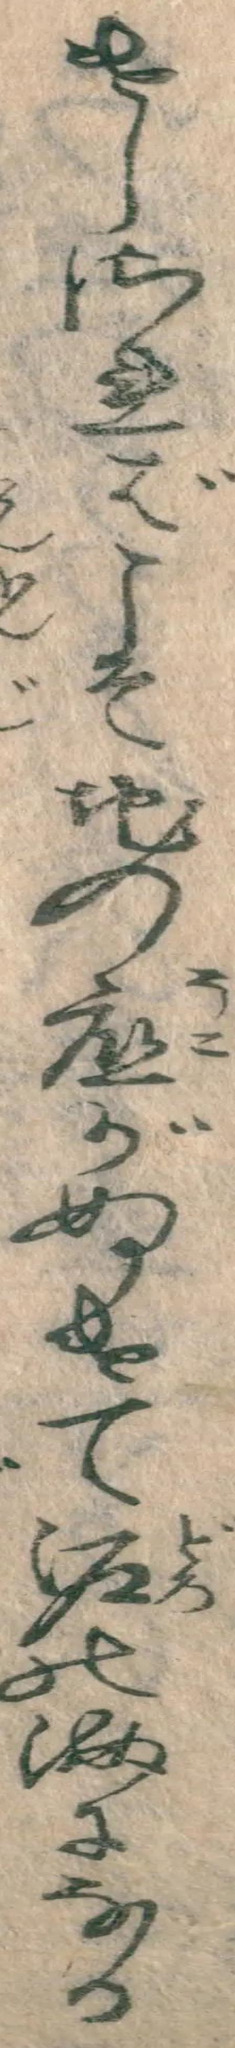けしさればこそ地の底がぬけて泥の海になる
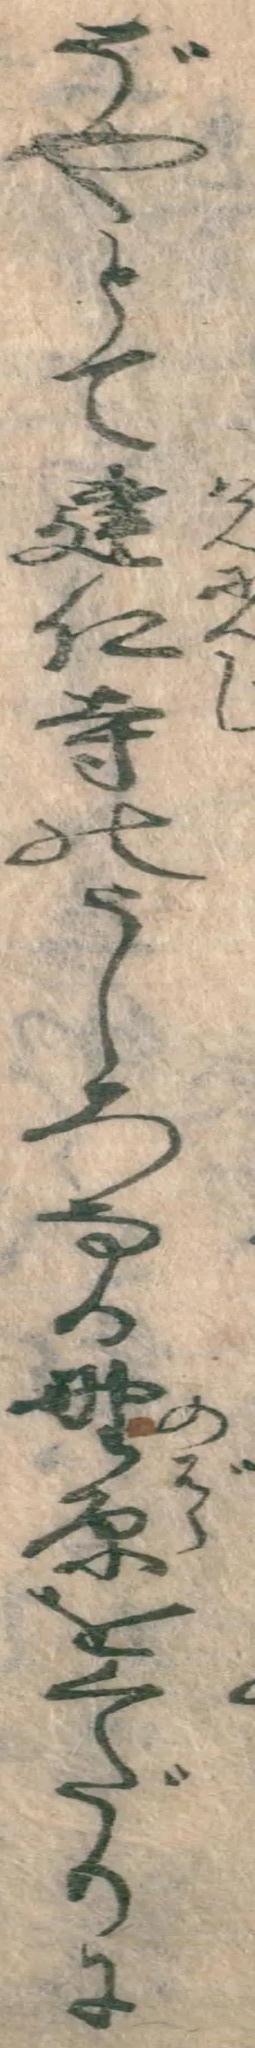ぞやとて建仁寺のうしろなる野原をくだりに
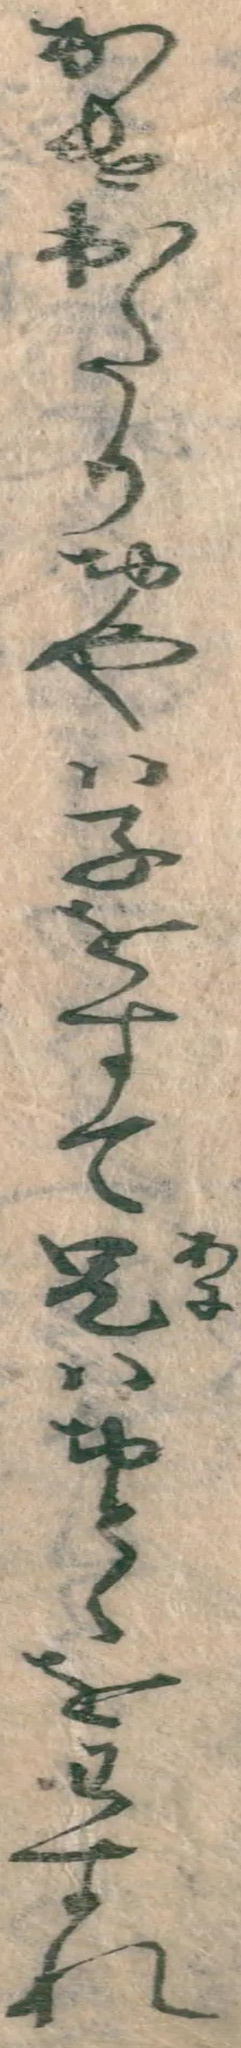かけ出たりおやは子をすて兄はおとゝをわすれ
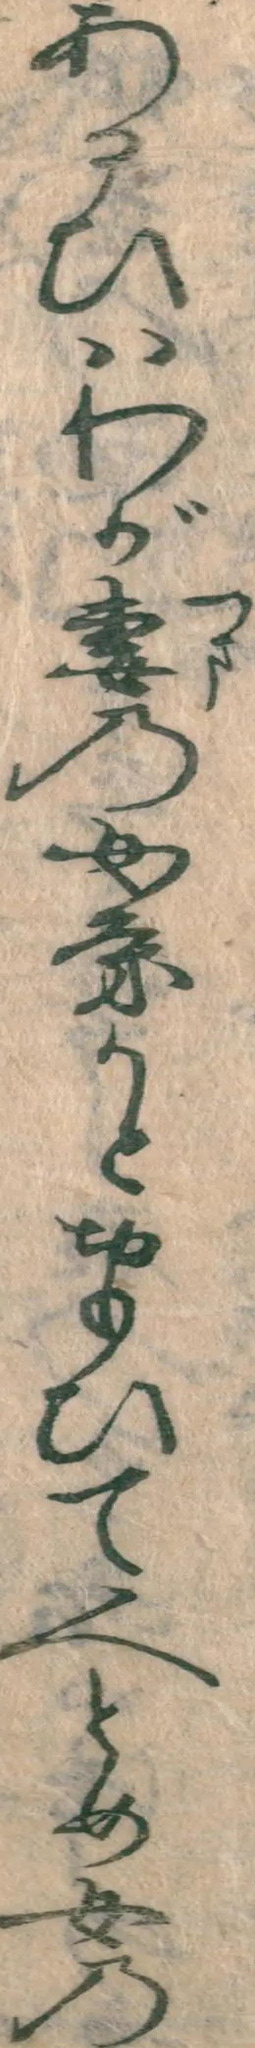あるひはわが妻の女房かとおもひて人とめ女の
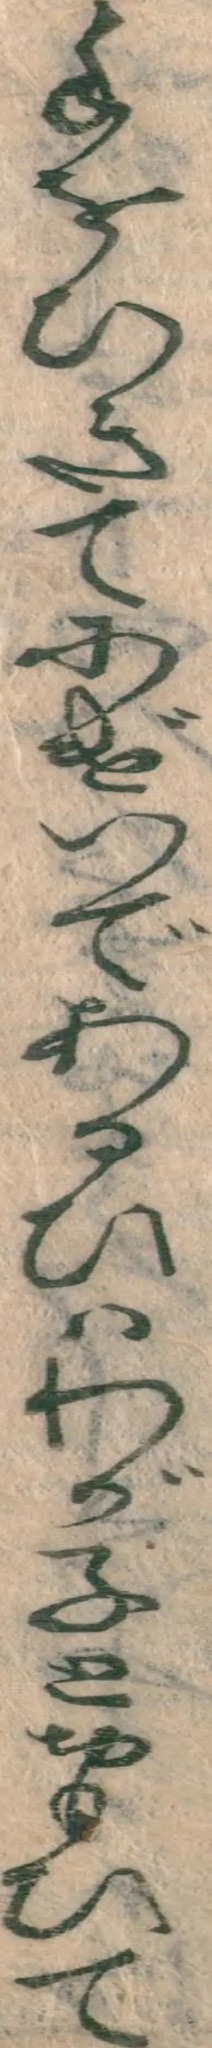手をひきてにげいであるひはわが子とおもひて
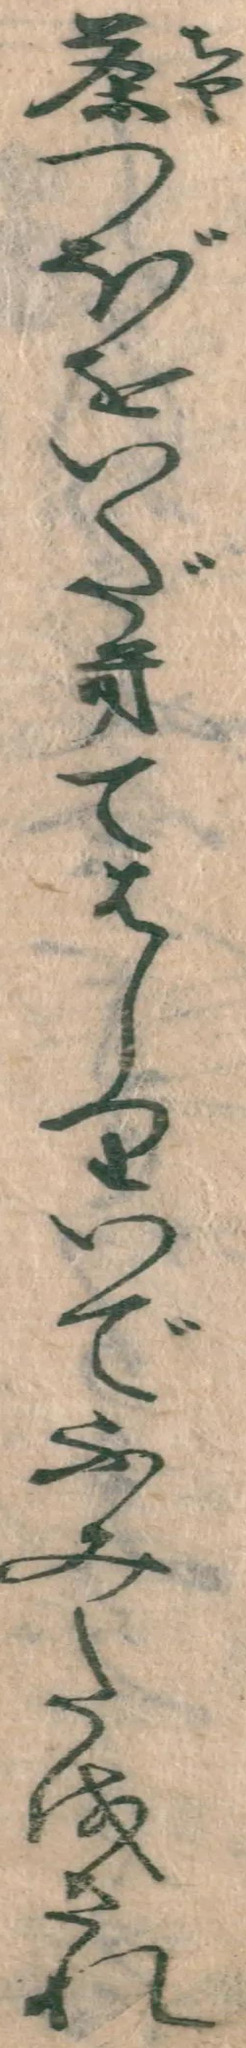茶つぼをいだきてはしりいでふみたをされ
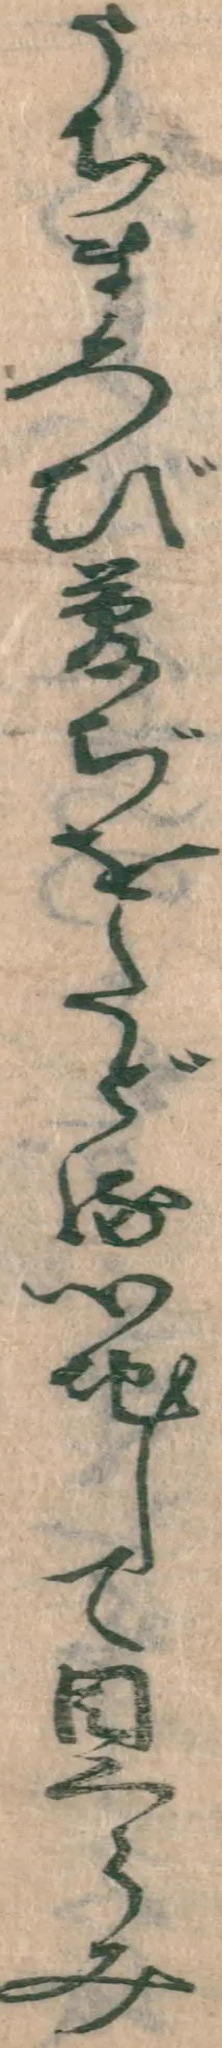うちまろび夢ぢをたどる心地して目くらみ
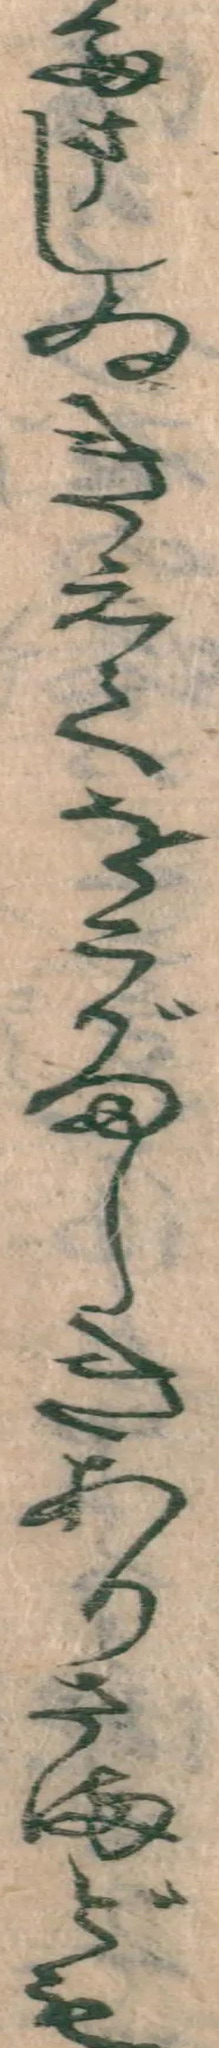たましゐきえてをこがましきありさまども
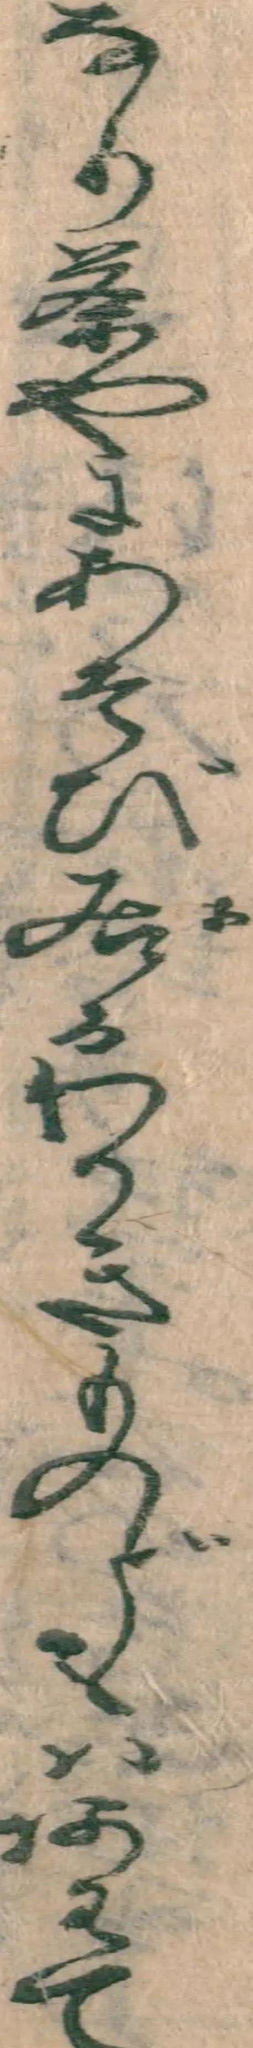なり茶やにあそび居るわかきものどもはあわて
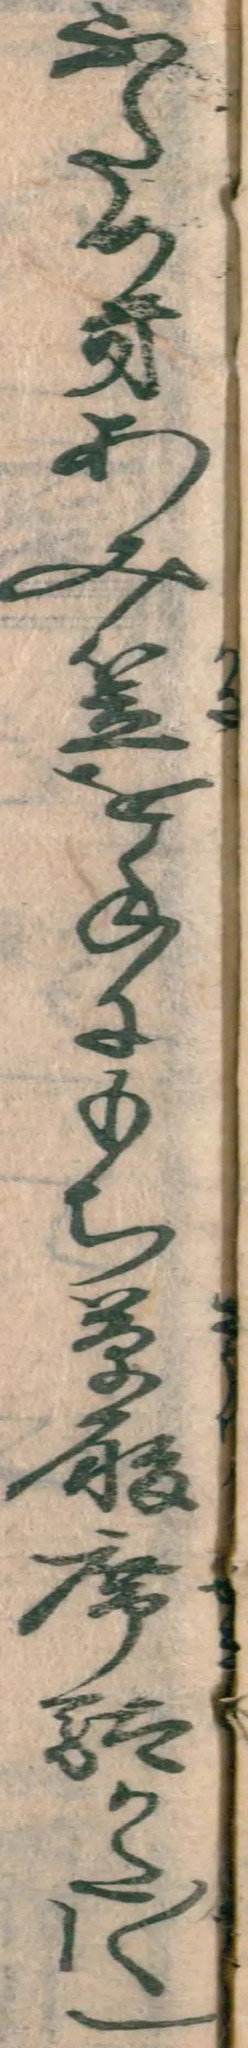ふためきあみ笠を手にもち草履席駄かた〳〵し
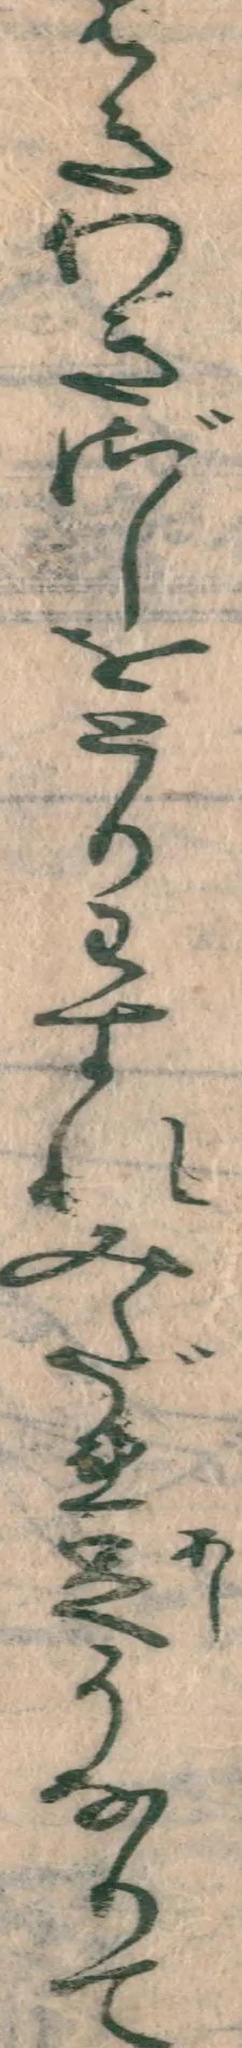はきわきざしをとりわすれみだれ足になりて
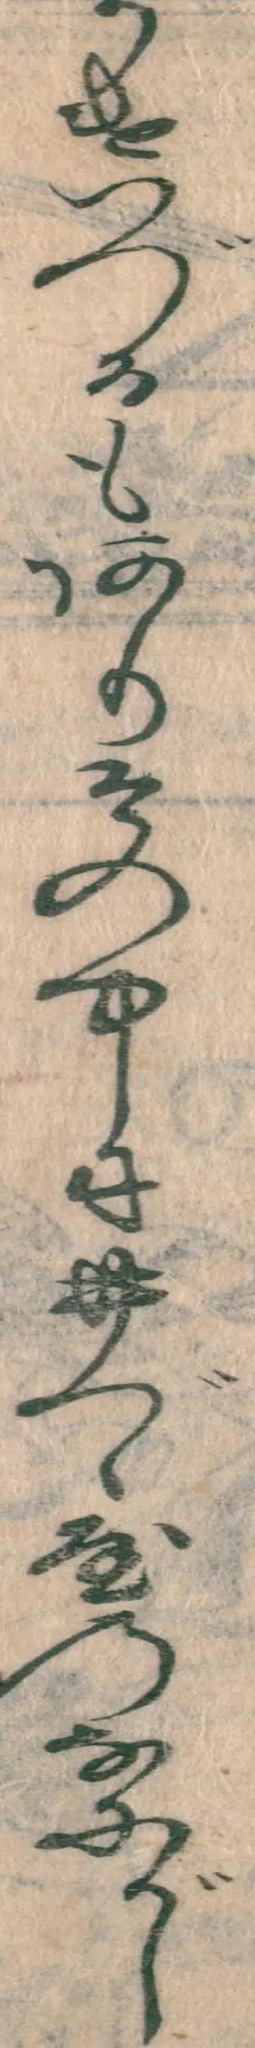かけいづるも何もその中に井づつ屋のなにがし
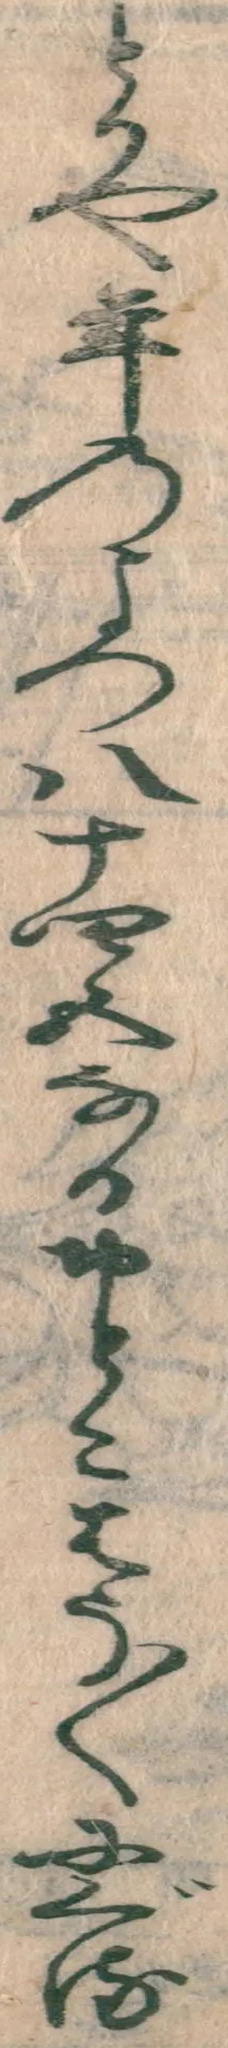とかや年のころは八十四五なるおとこはう〳〵にぐる
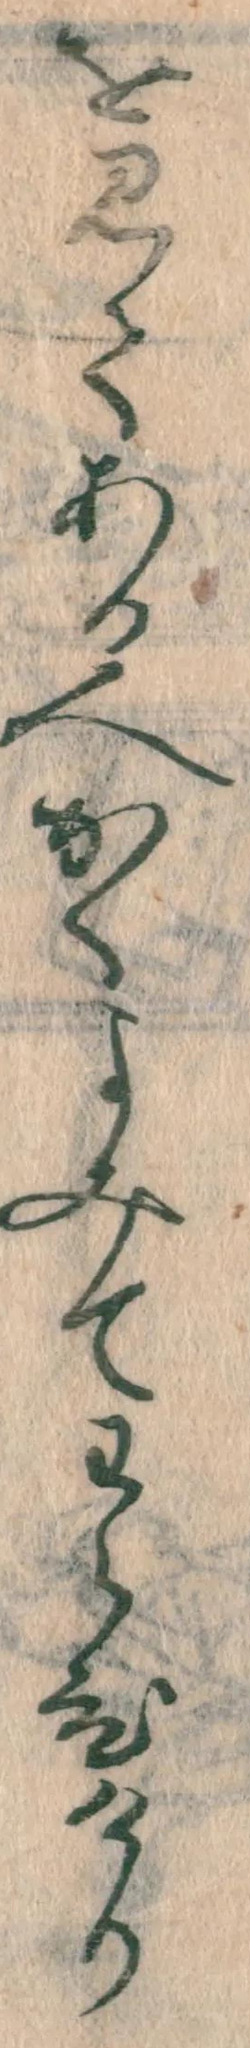を見てある人かくよみてわらひけり
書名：艱難目異志. 上,下
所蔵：国立国会図書館 National Diet Library, JAPAN
